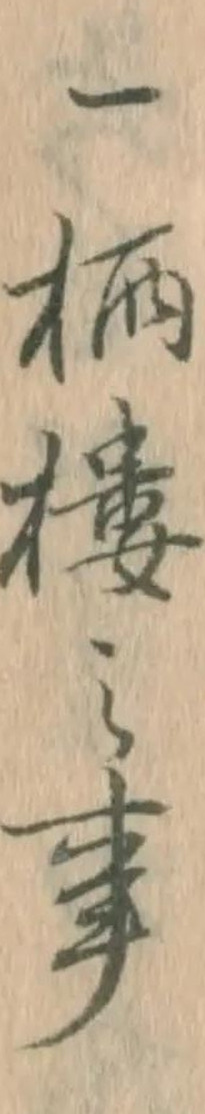一栖樓之事
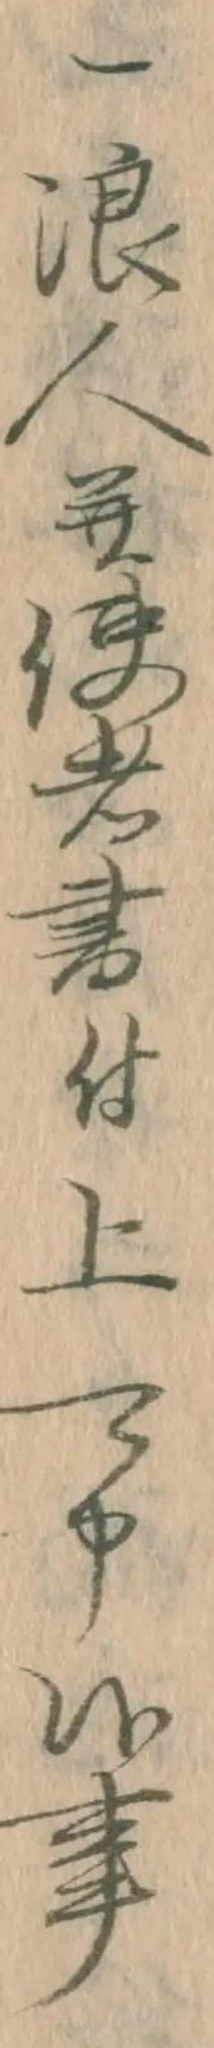一浪人幷使者書付上可申候事
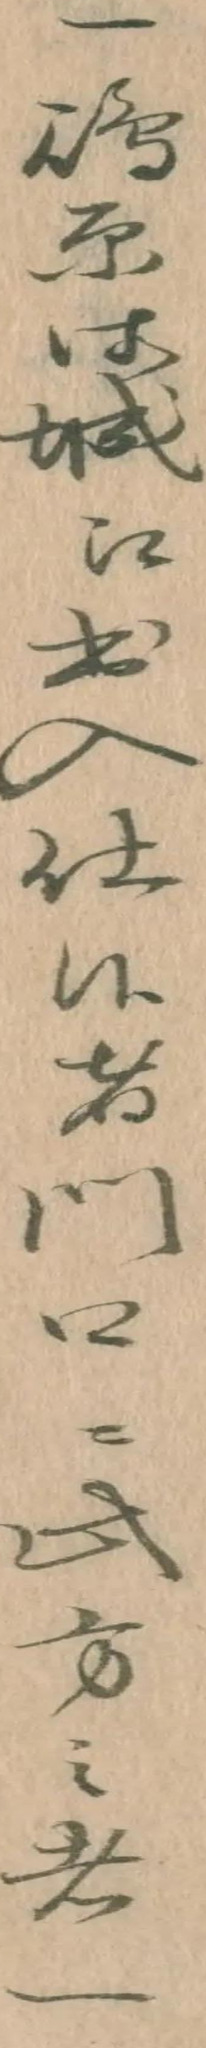一島原御城江出入仕候者門口に此方之者一
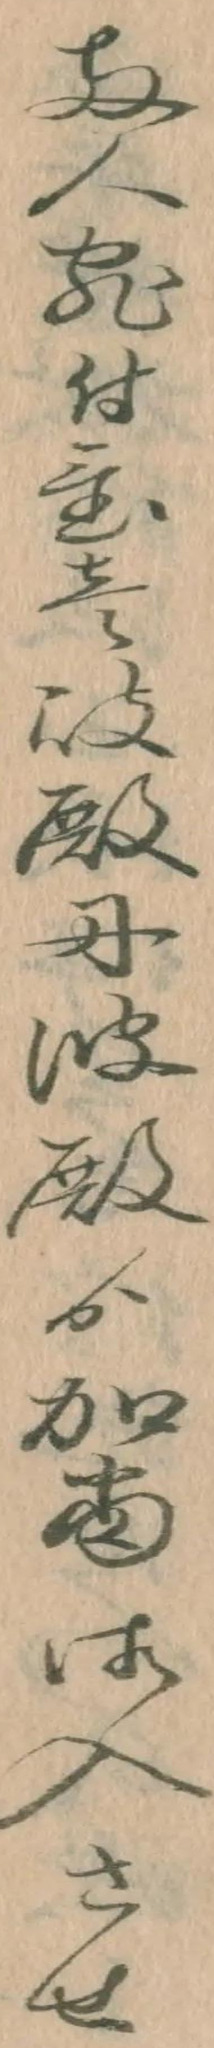両人宛付置壱岐殿丹波殿ゟ加番御入させ
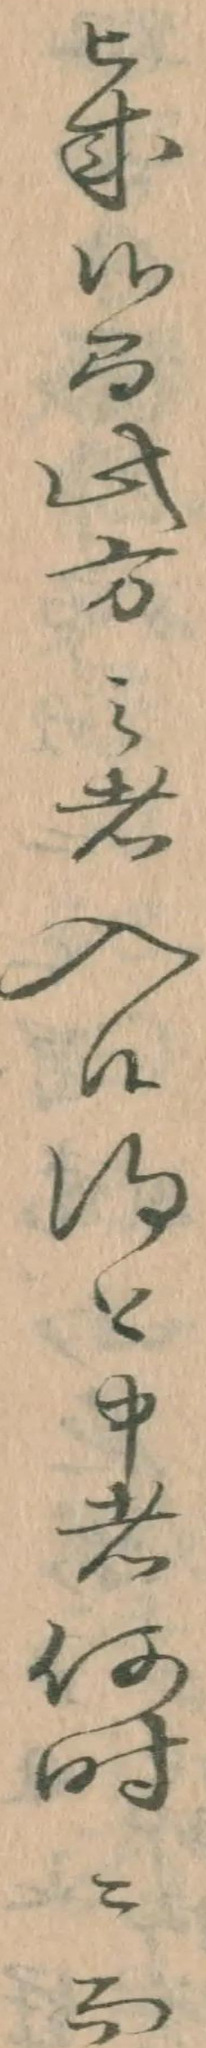被成候間此方之者入候得と申者何時に而
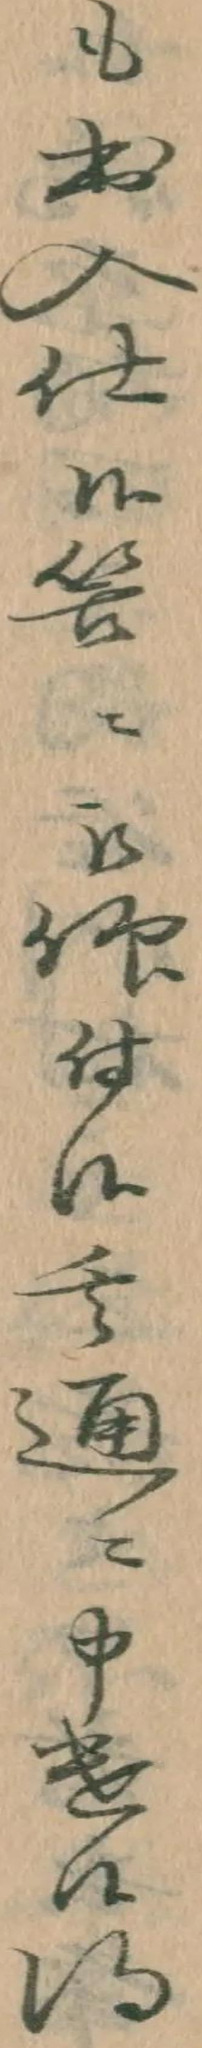も出入仕候筈に被仰付候其通に申遣候得
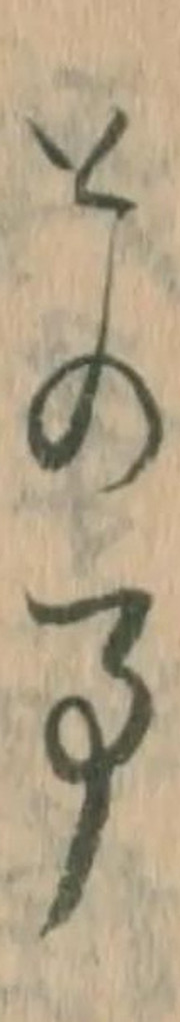との事
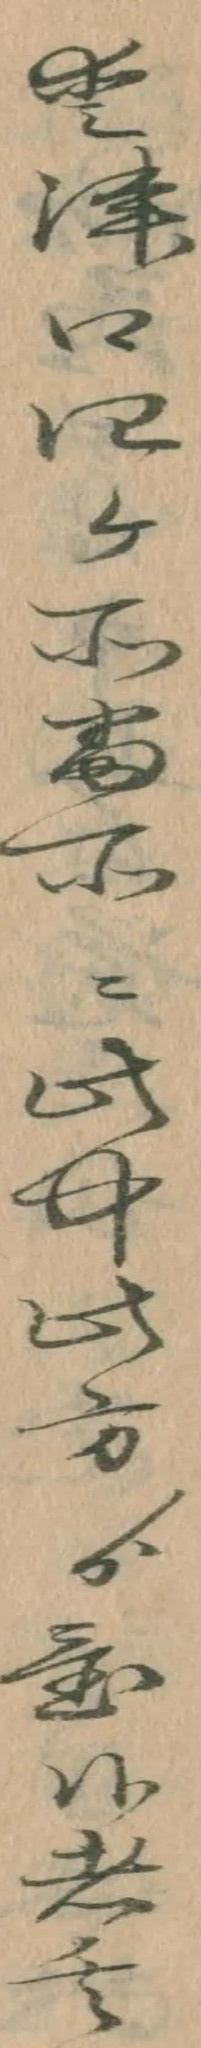一愛津口四け所番所に此中此方ゟ置候者其
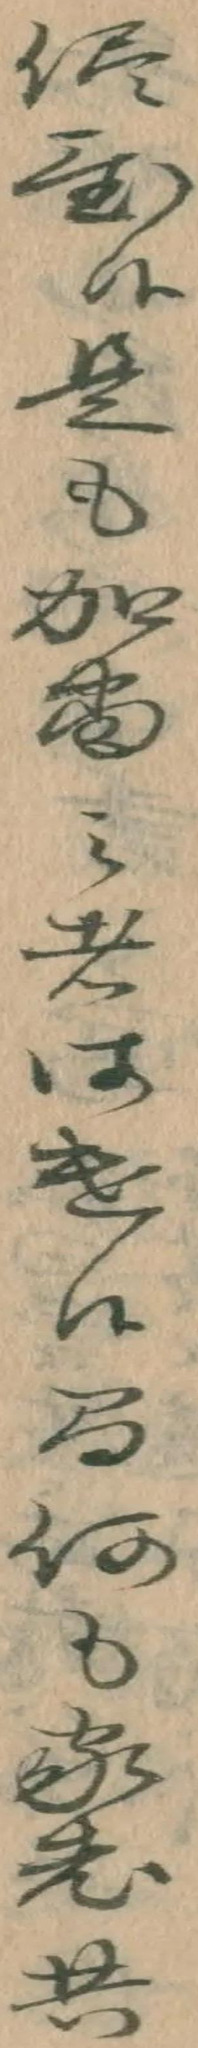侭置候是も加番之者御遣候間何も家老共
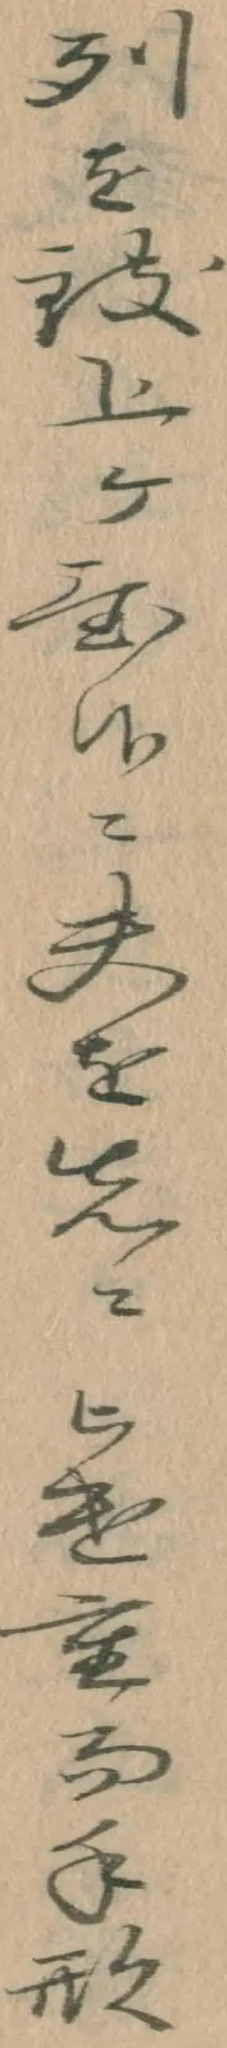列を致上け置候に夫を先に被遣重而手形
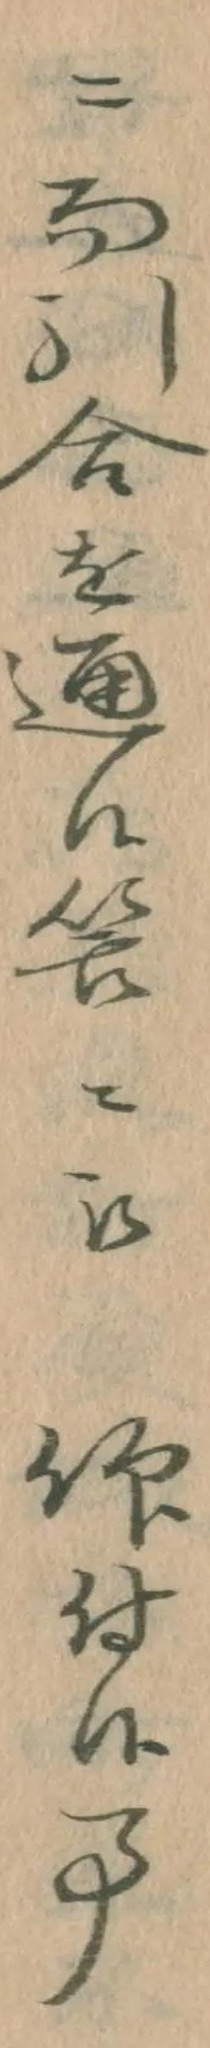に而引合を通候筈に被仰付候事
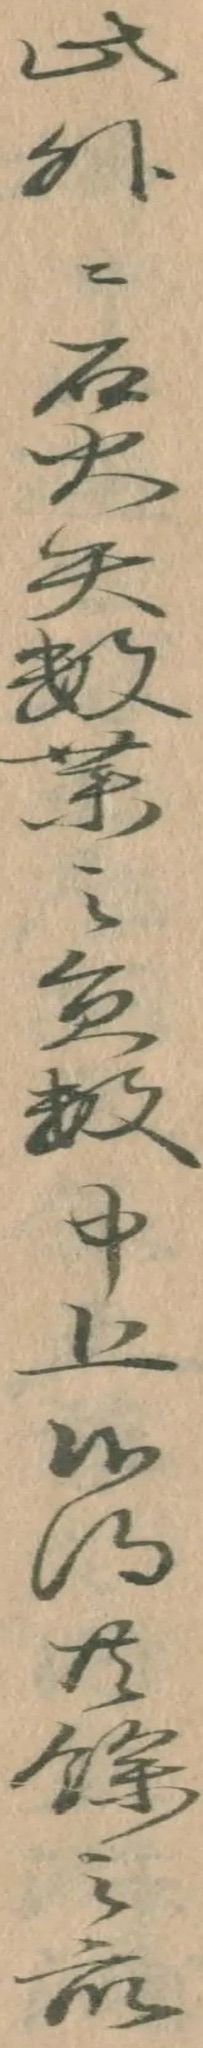此外に石火矢数薬之員数申上候得共余之衆
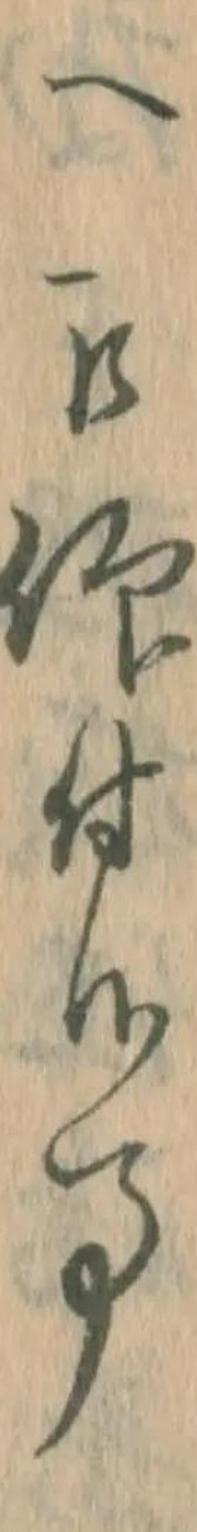へ被仰付候事

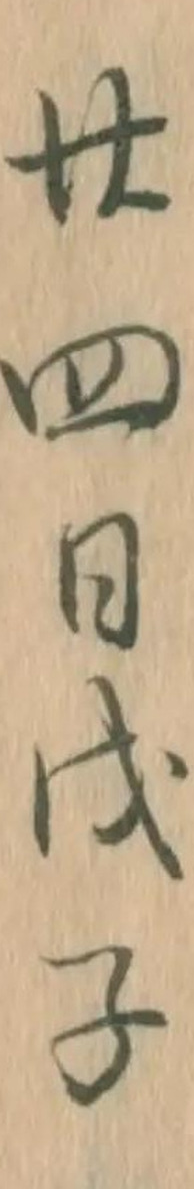廿四日戌子
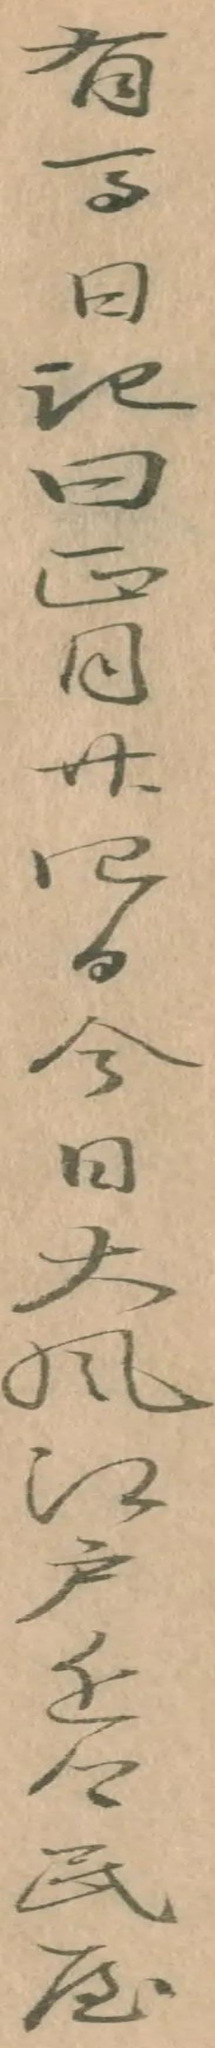有馬日記曰正月廿四日今日大風江戸近郷民屋
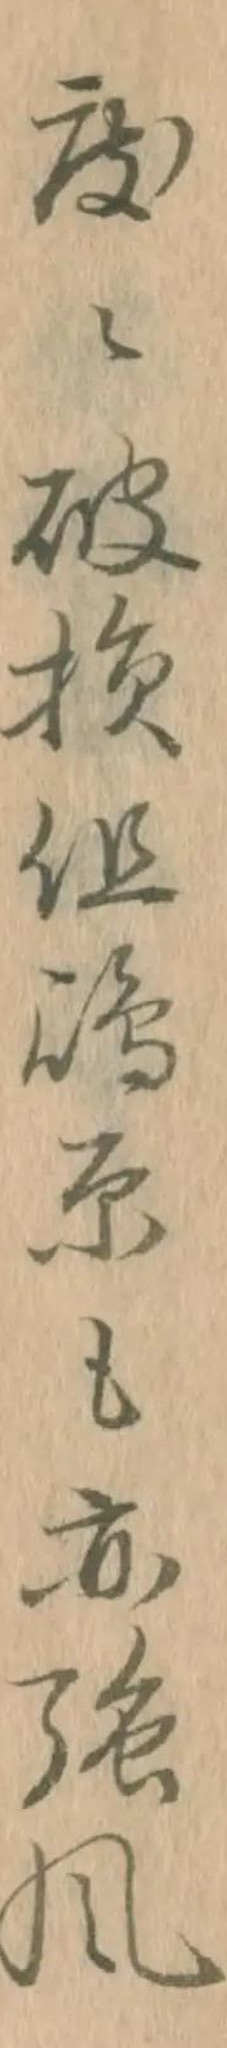度々破損但島原も亦強風
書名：切支丹御退治記 49巻. [6]
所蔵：国立国会図書館 National Diet Library, JAPAN
